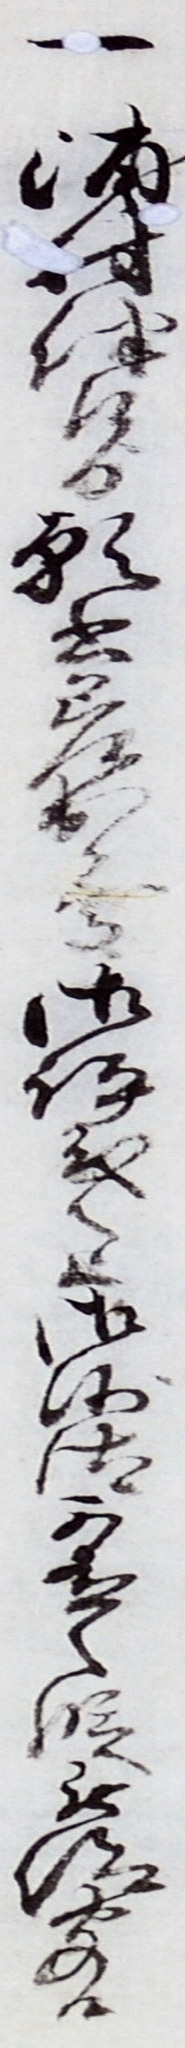一浦村伴左衛門願書差出候処御評義之上御沙汰可有之段被仰聞候
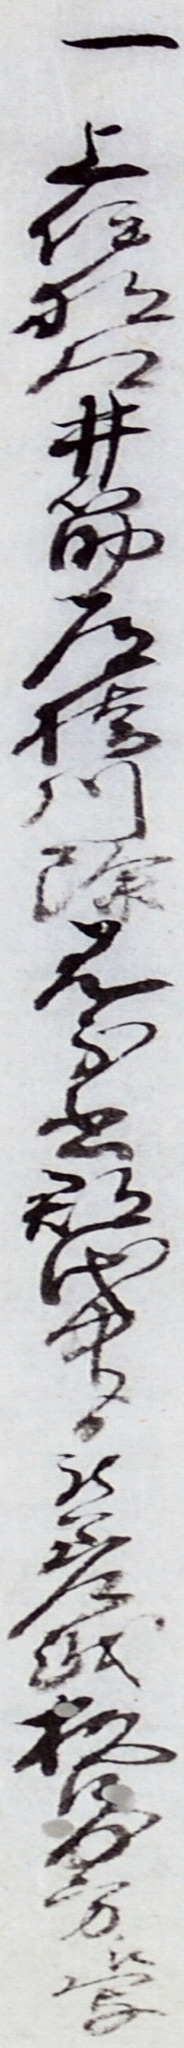一上伊那郷井筋道橋川除見分書郡代中より被差越杉左衛門方江写
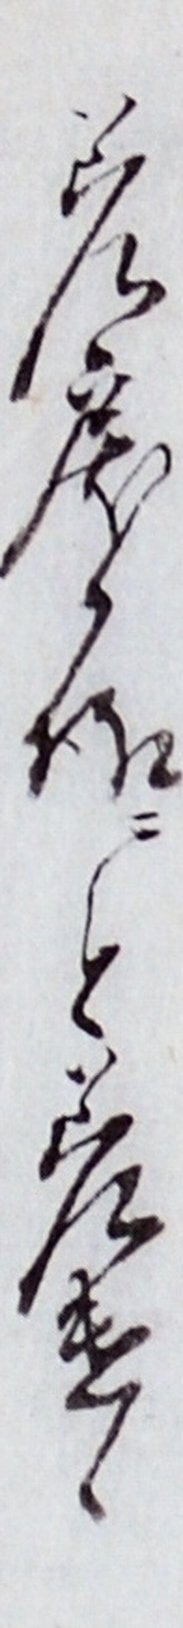差戻候様ニと差遣候
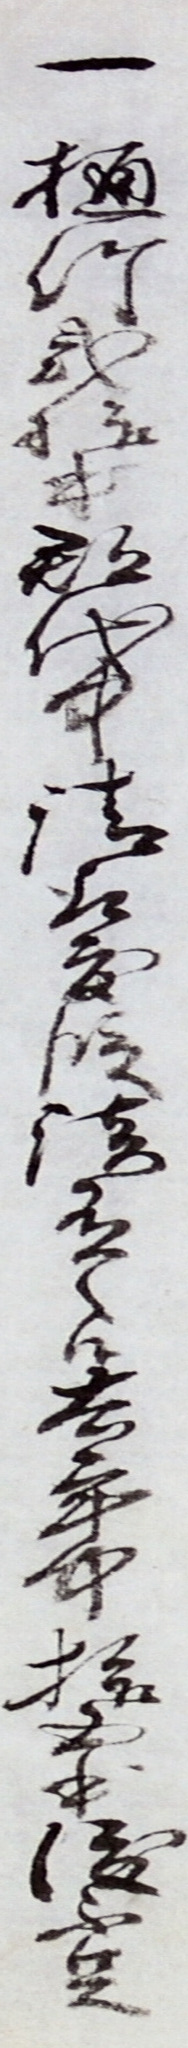一樋竹弐拾本郡代中請取度段詰有之候去年中拾五本渡不足
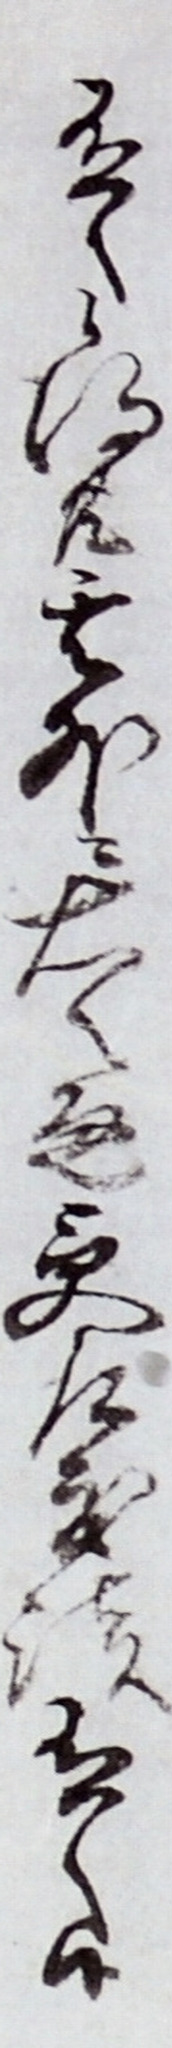有之候得共其外ニ右之通更ニ度談有之候
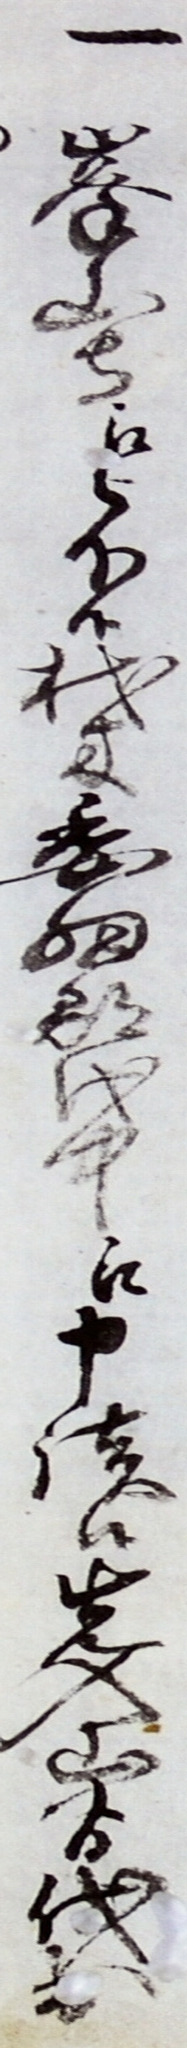一峯山ち被下候材木委細郡代中江申談候先入山より方代出
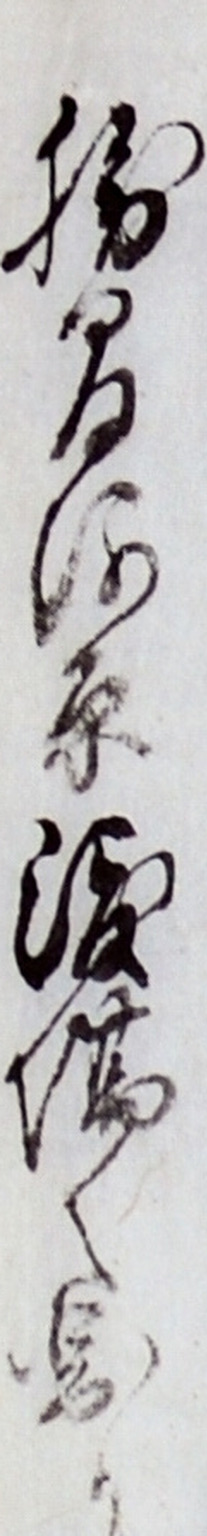勝間河原渡場之図り

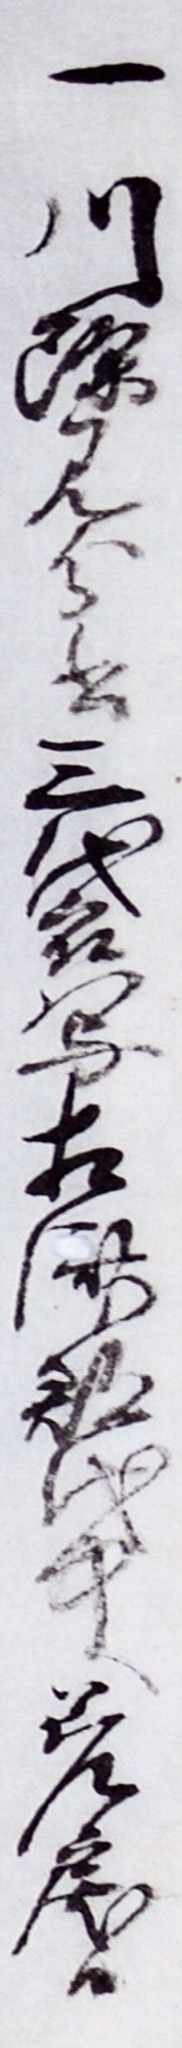一川除見分并三代官写相済郡代中差戻候
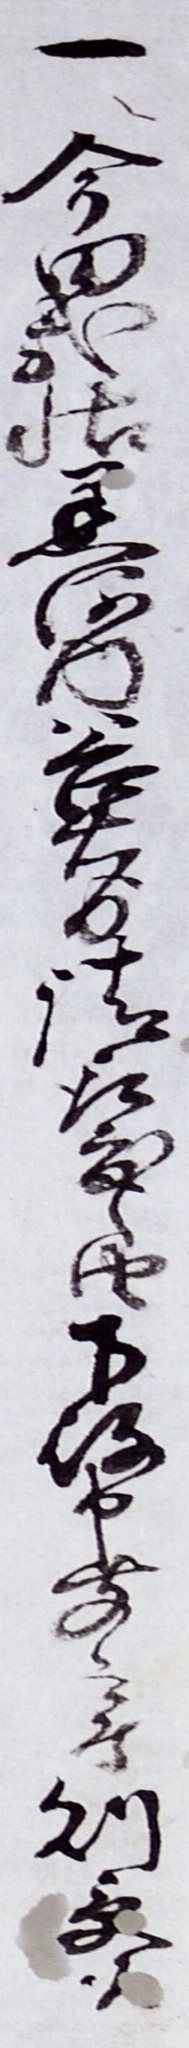一今田弐帳黒河内善左衛門請取度候由下役申聞候ニ付則受取
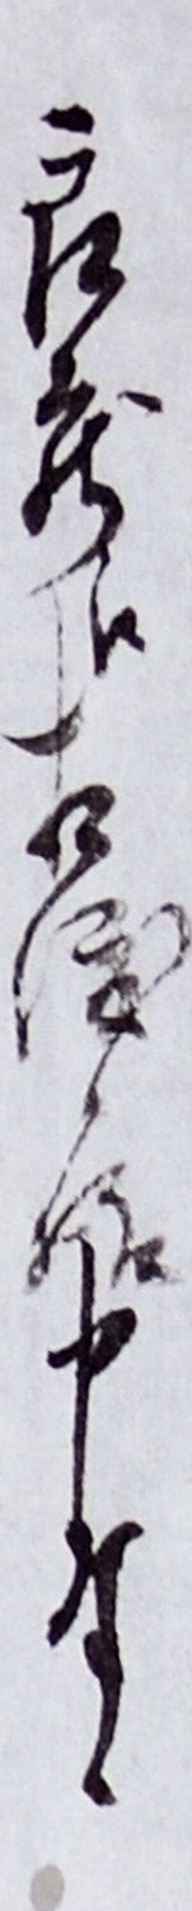良蔵江相渡候様申付候
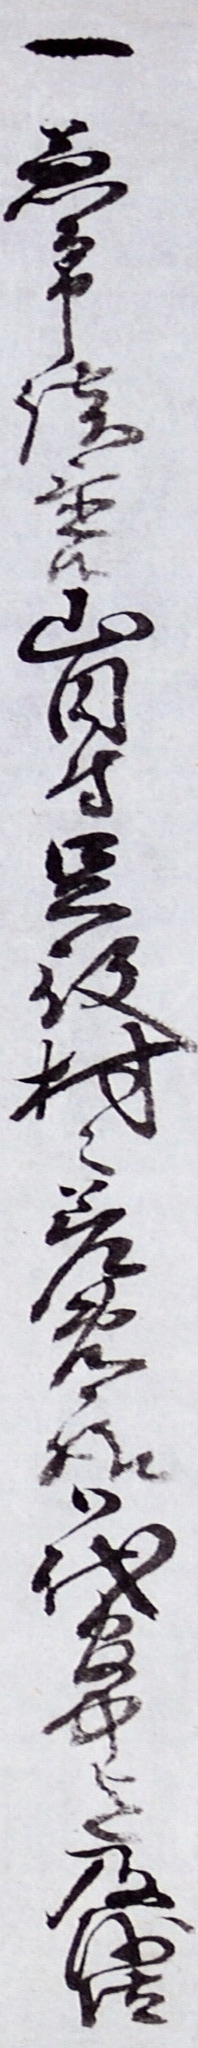一兼而申談置候山目付足役村々差免候様御代官中迄及沙汰
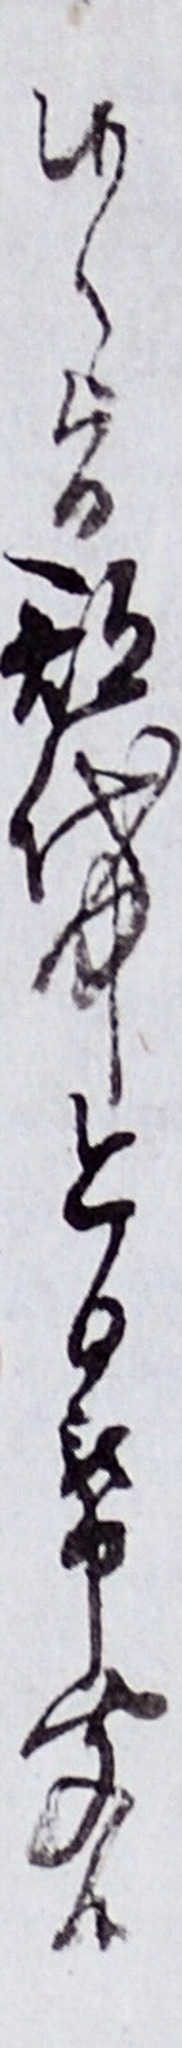候之旨郡代中と日被申聞候
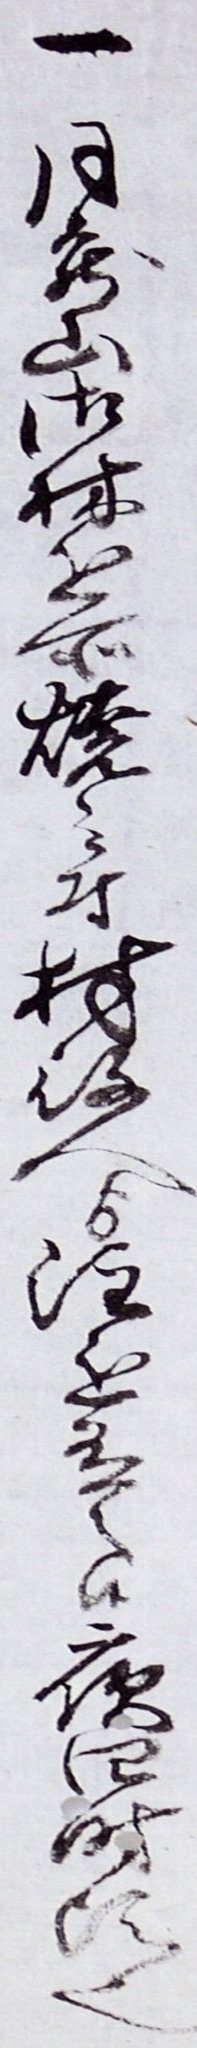一月蔵山御林近所焼候ニ付村役人より注進有之候夜四時頃也
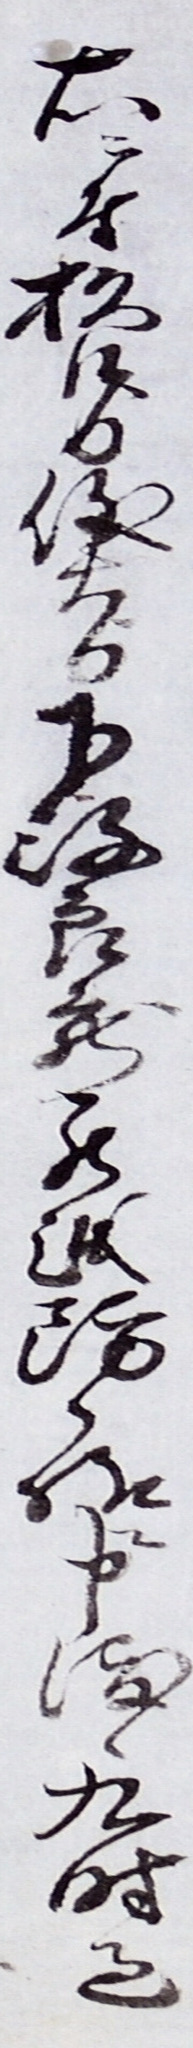右ニ付杉左衛門儀左衛門下役良蔵罷越防候様ニ申渡候九時過
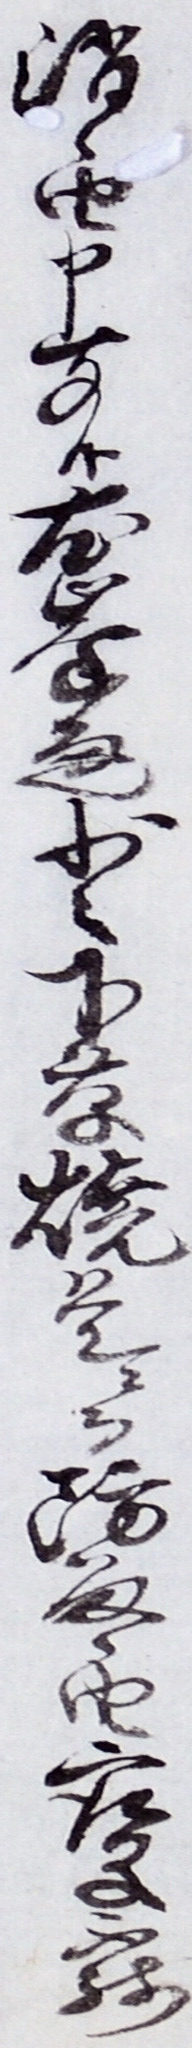消候由申聞候尤峯通少々下草焼是ニ而防留候最早不残
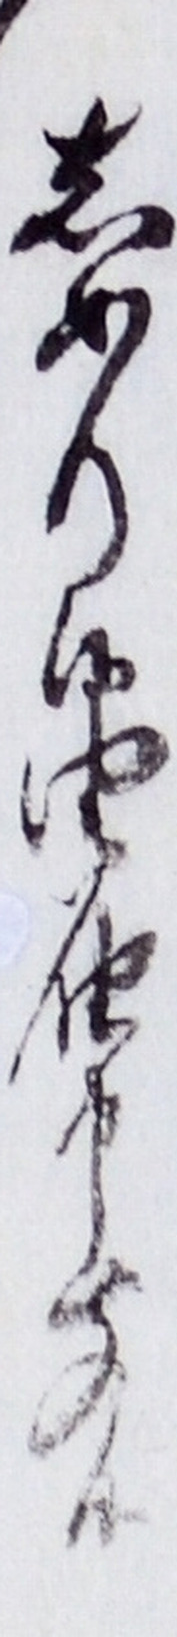しめり候由届申聞候
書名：御山奉行御用控
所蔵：伊那市立高遠町図書館・合同会社AMANE
